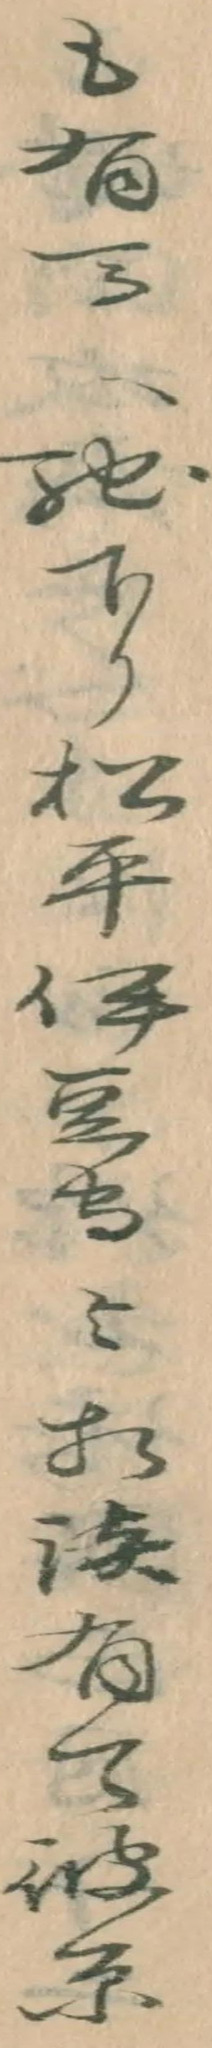も有馬へ馳下り松平伊豆守与相談有て彼原

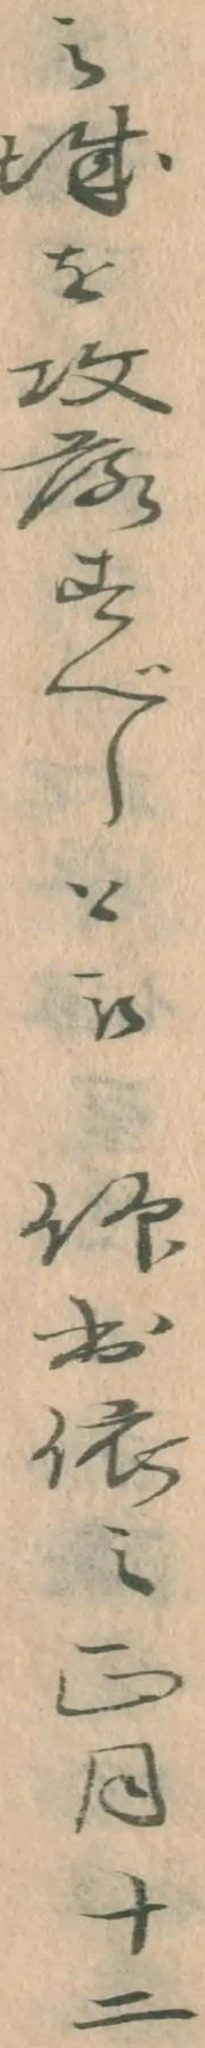之城を攻落春べしと被仰出依之正月十二
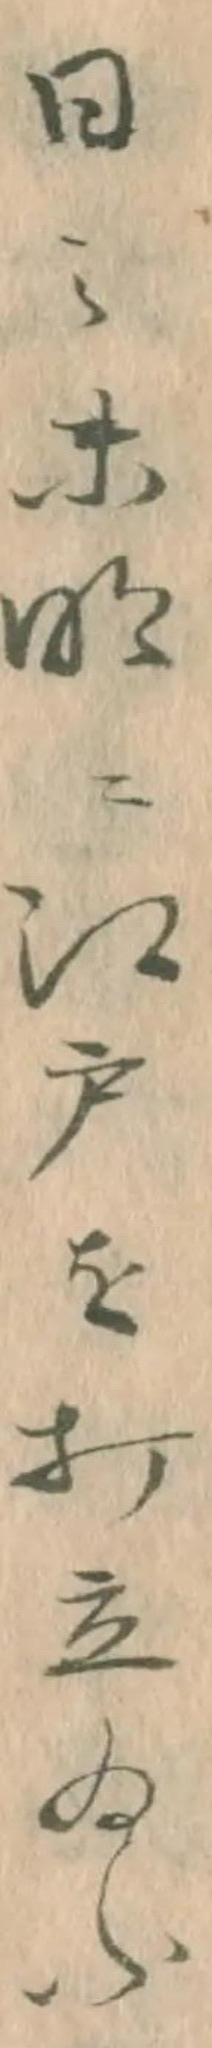日之未明に江戸を打立ゐふ
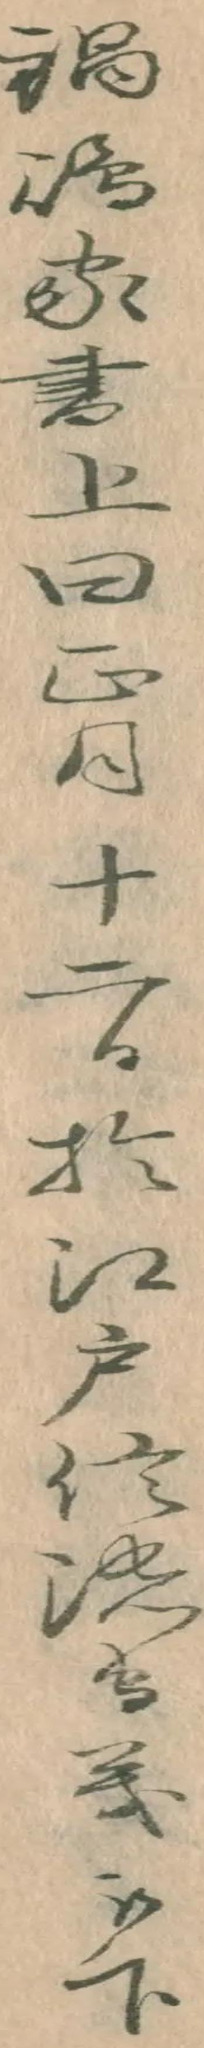鍋島家書上曰正月十二日於江戸信濃守義被下
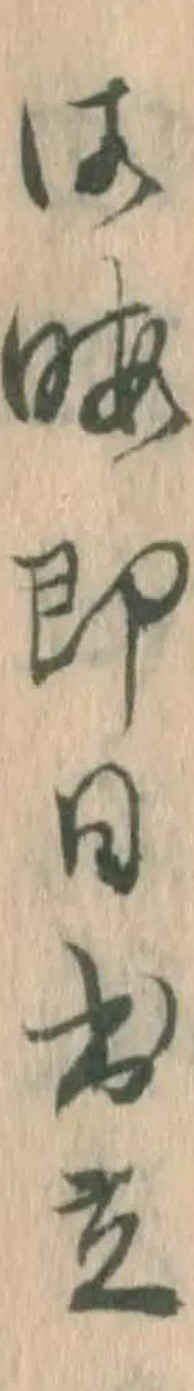御暇即日出立
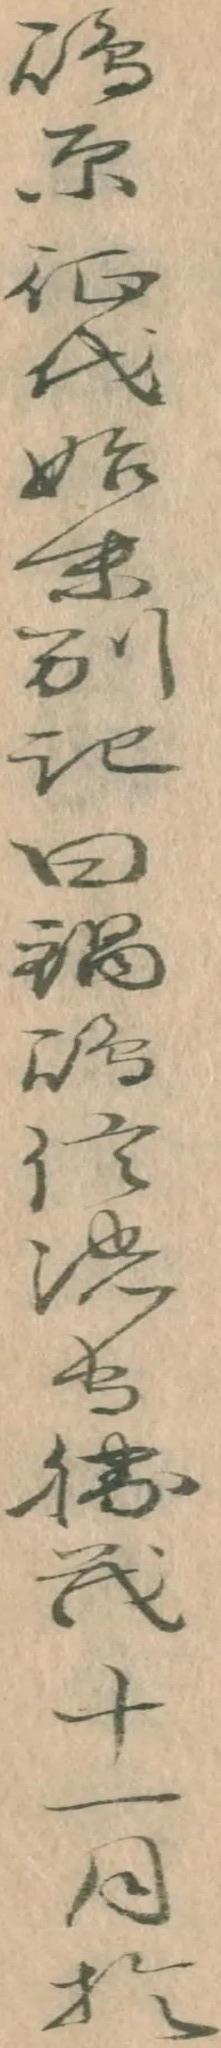島原征伐始末別記曰鍋島信濃守勝茂十一月於
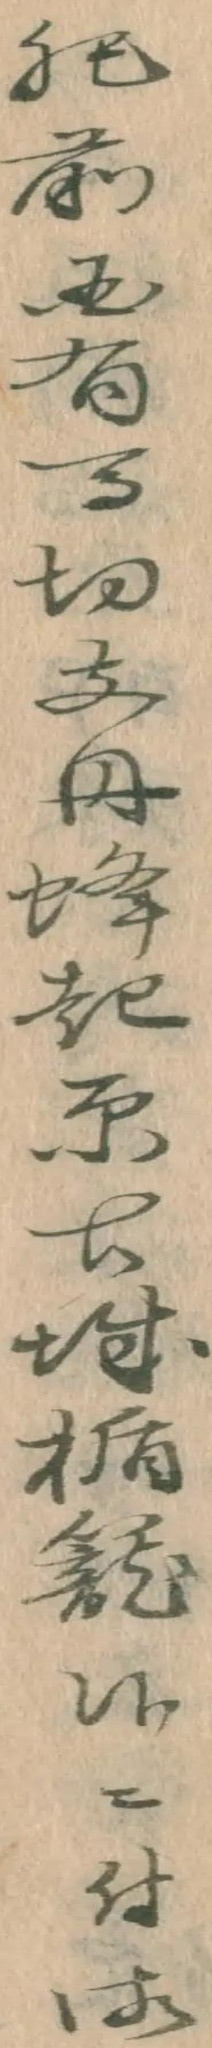肥前国有馬切支丹蜂起原古城楯籠候に付御
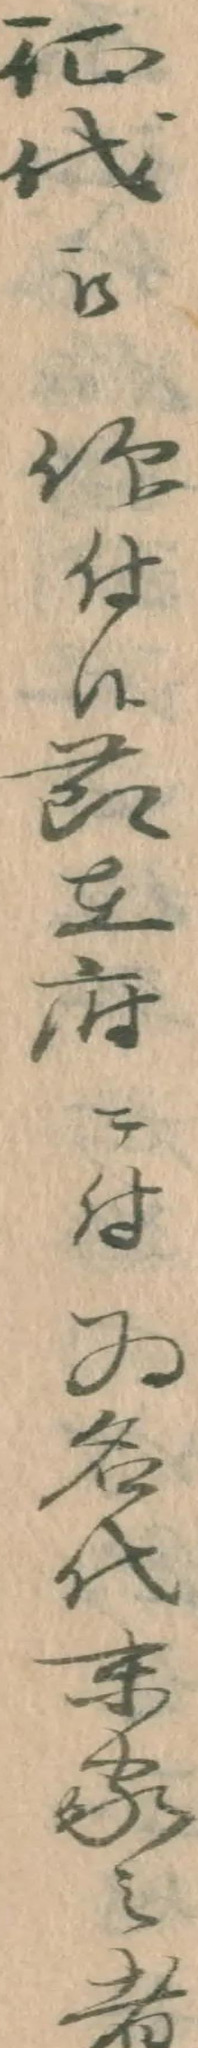征伐被仰付候節在府に付ゐ名代末家之者
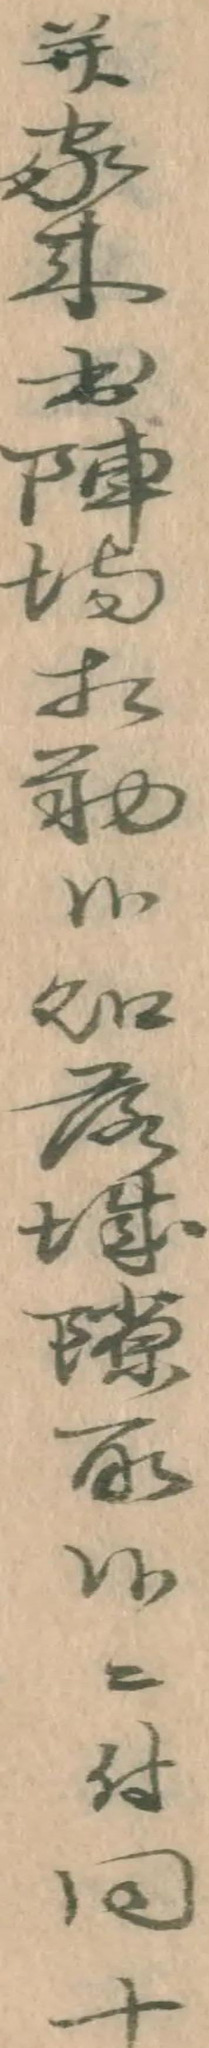幷家来出陣場相勤候処落城隙取候に付同十
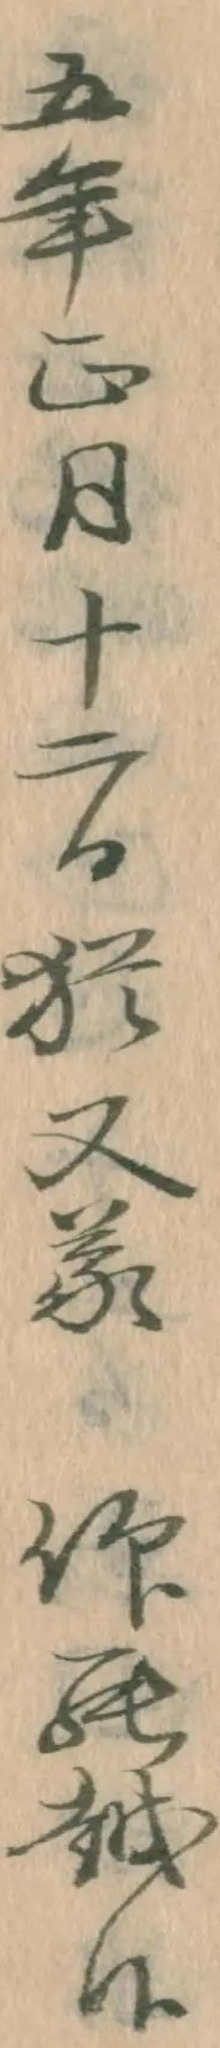五年正月十二日猶又蒙仰罷越候
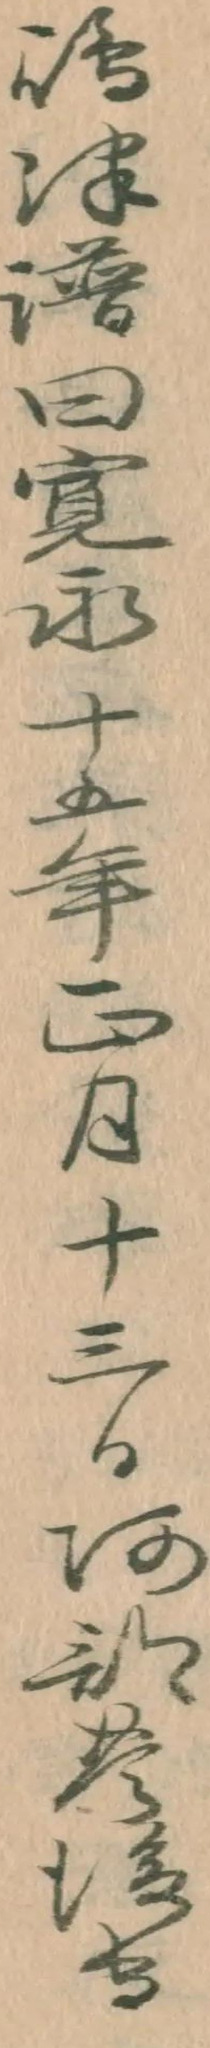島津譜曰寛永十五年正月十三日阿部豊後守
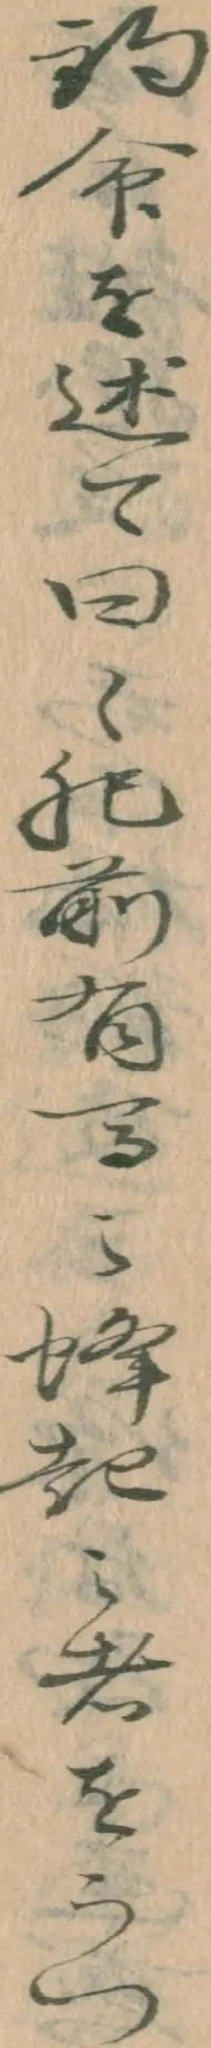釣命を述て曰く肥前有馬之蜂起之者をうつ
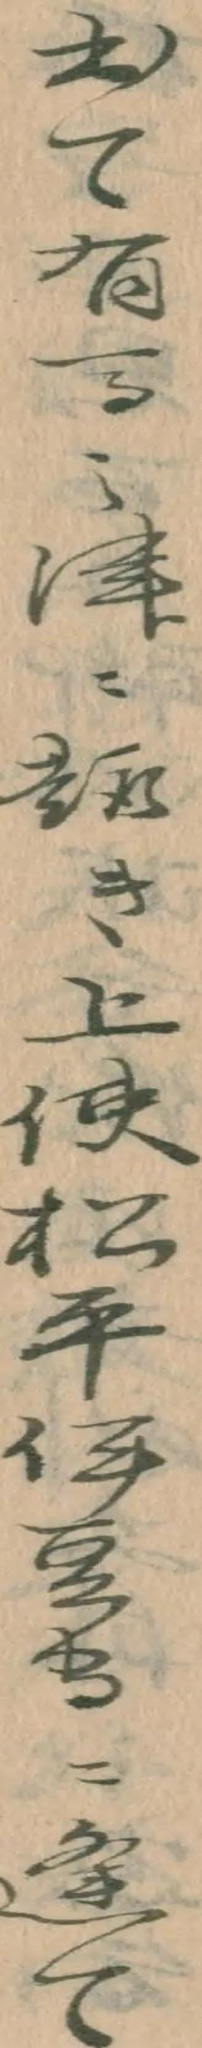出て有馬之津に趣き上使松平伊豆守に逢て
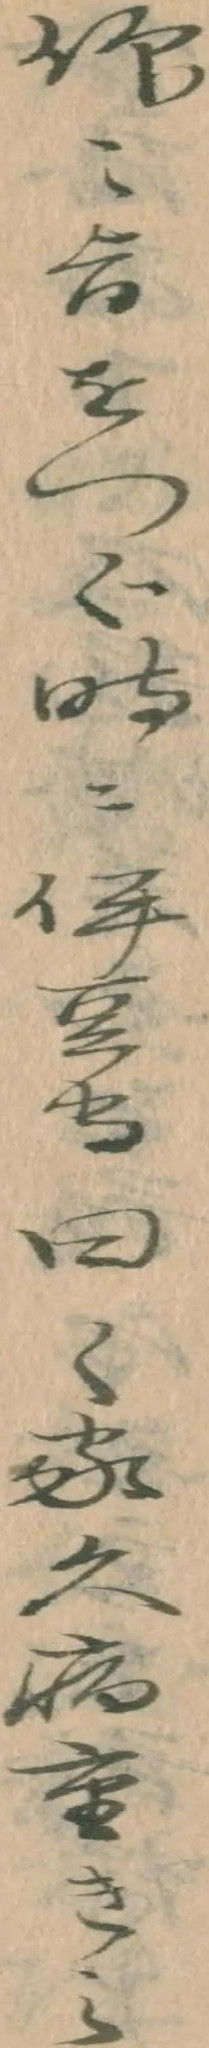仰之旨をつぐ時に伊豆守曰く家久病重き之
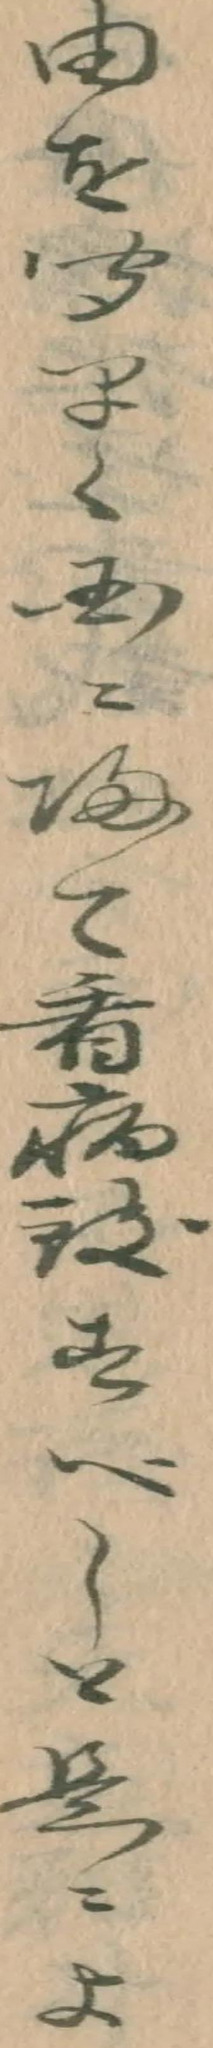由を聞早く国に帰て看病致春べしと是によ
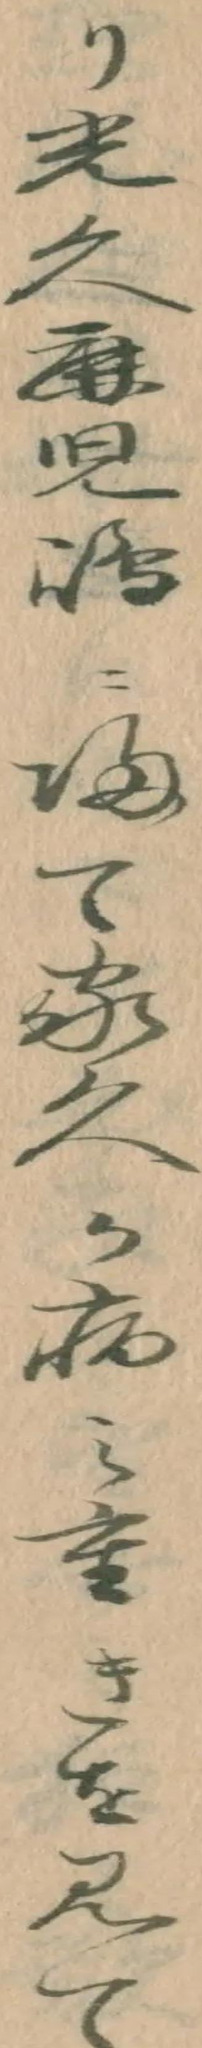り光久鹿児島に帰て家久か病之重きを見て
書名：切支丹御退治記 49巻. [6]
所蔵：国立国会図書館 National Diet Library, JAPAN
